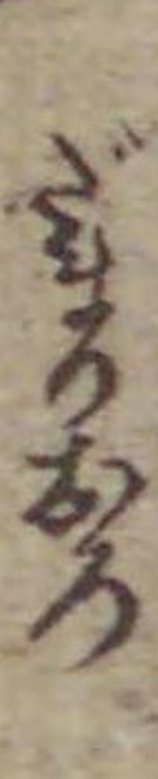だまりおろ

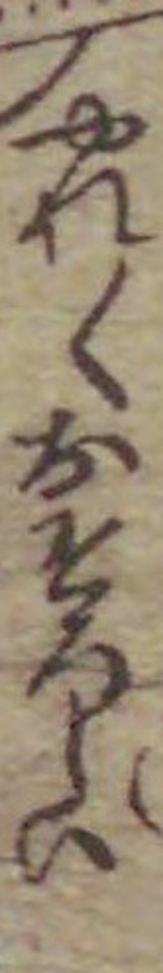やれ〳〵おそろしい
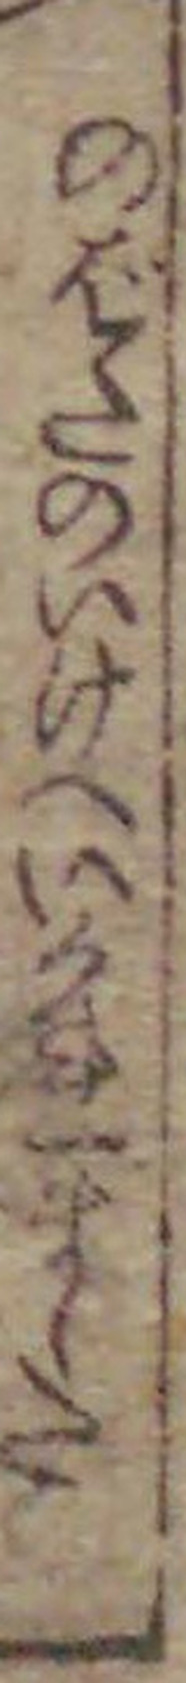のばたのいけへいかれました
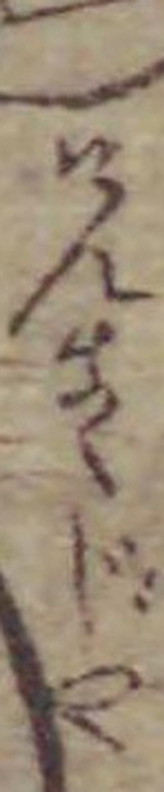けんまくじや
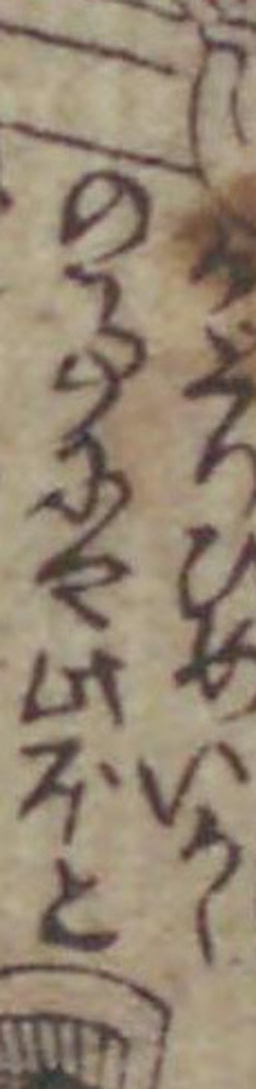の事にや此ほと
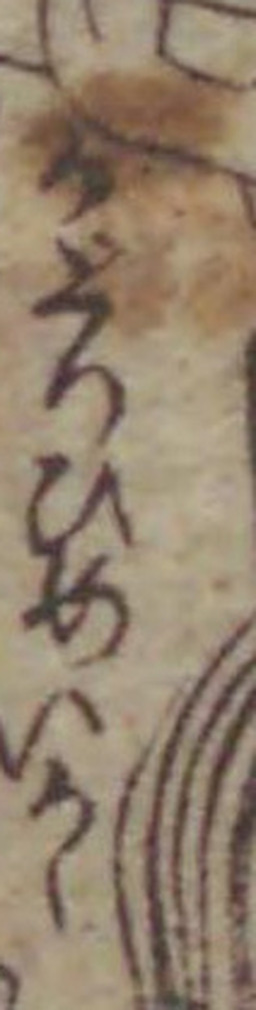かとりひめいかゝ
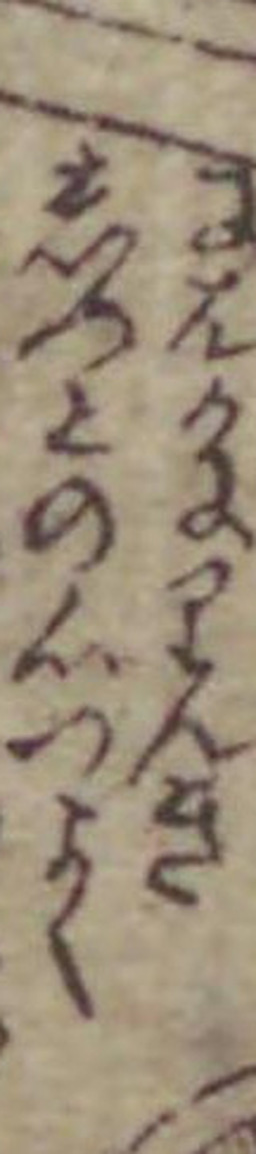しつとの心つよく
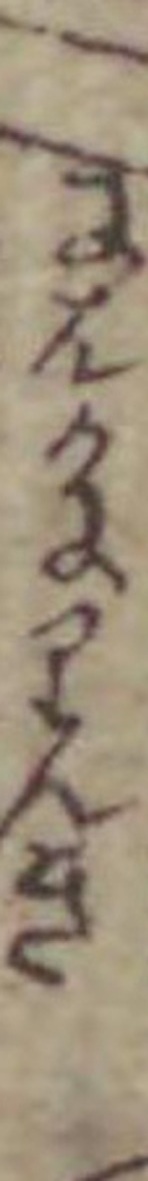にはかにりんき
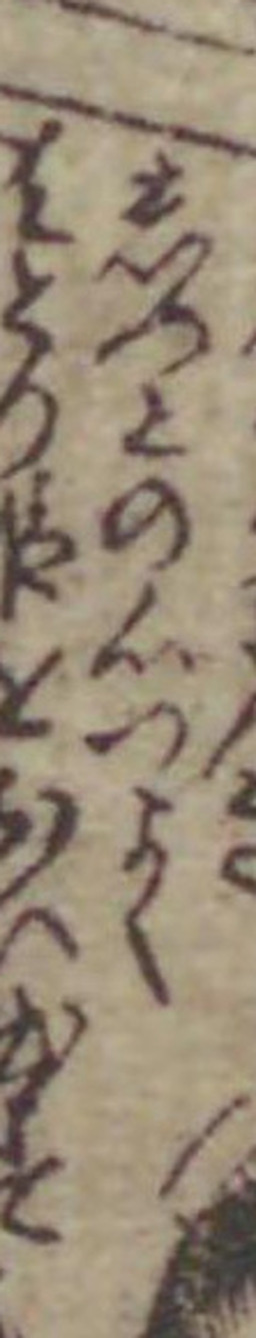はとり姫をおい出す
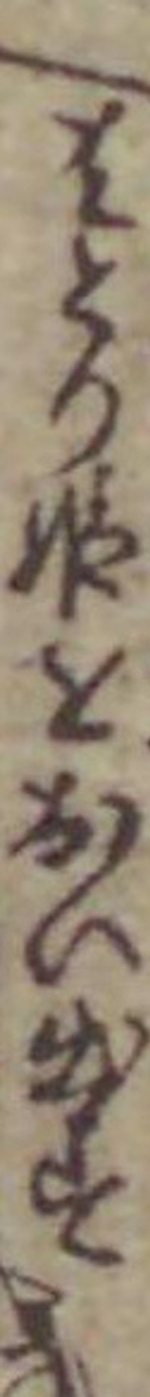はとり姫をおい出す
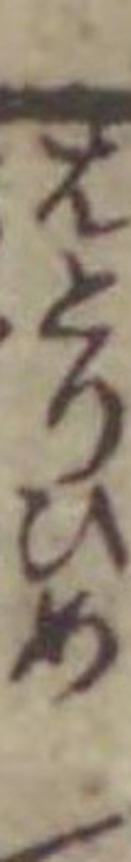はとりひめ
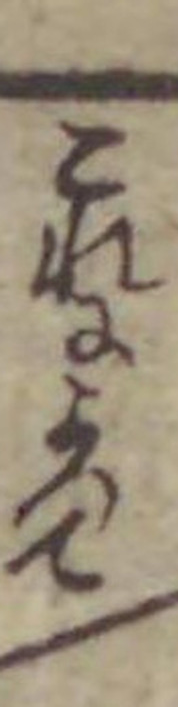これによって
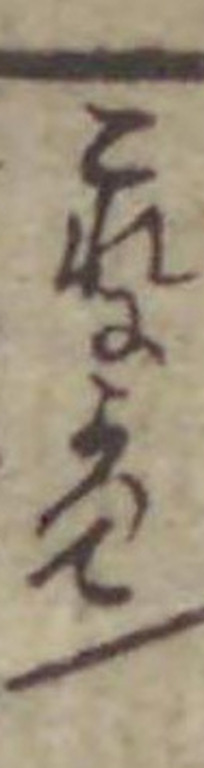これによって
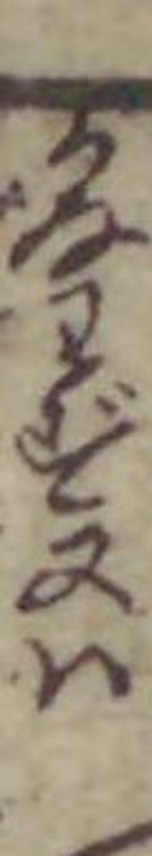かなわずま又は
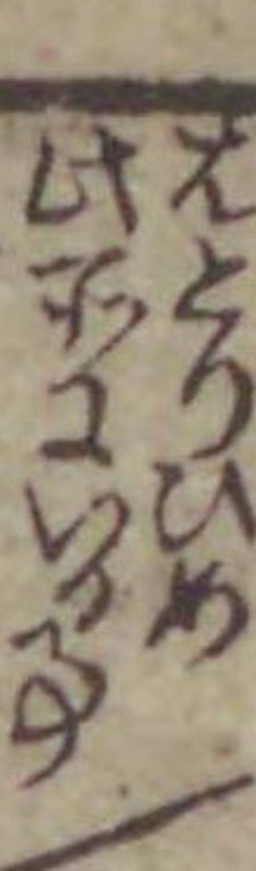此所にいる事
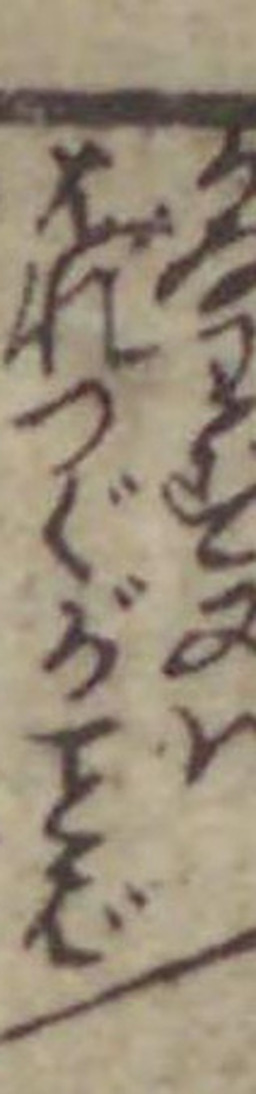はれつぐがことば
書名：娜二代鉢木 5巻
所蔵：国立国会図書館 National Diet Library, JAPAN
